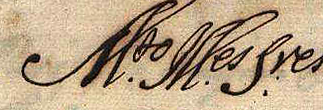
M.to Ill.es S.res
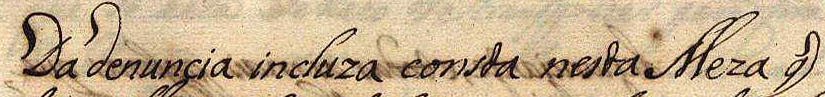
Da denuncia incluza consta nesta Meza q̄
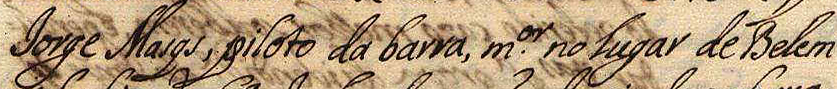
Iorge Masqs, piloto da barra, m.or no Lugar de Belem
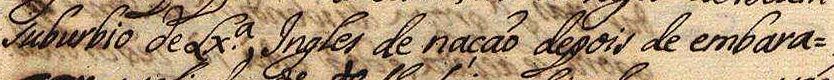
suburbio de Lx.a, Ingles de nação depois de embara
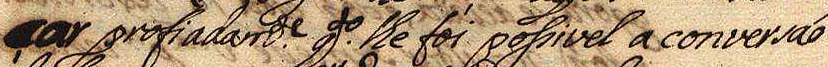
çar profiadam.te q.to lhe foi possivel a conversaõ
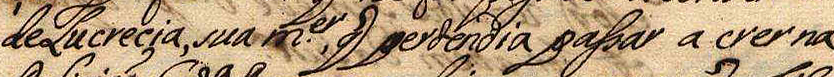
de Lucrecia, sua m.er, q̄ pertendia passar a crer na
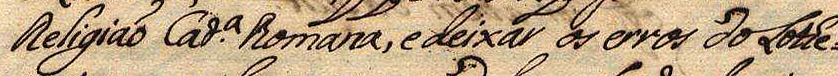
Religião Cat.a Romana, e deixar os erros do Lothe
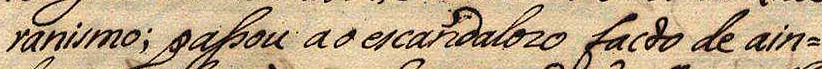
ranismo; passou ao escandalozo facto de a in
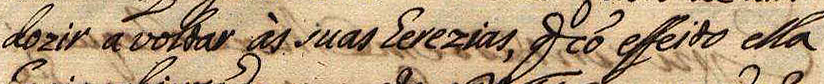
dozir a voltar às suas herezias, q̄ cō effeito ella
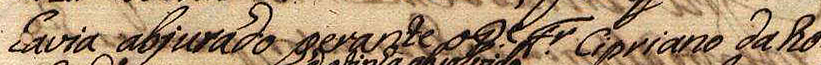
havia abjurado perante o P.e F.r Cipriano da Ro
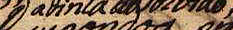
q̄ a tinha absolvido,
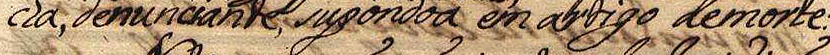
cha, denunciante, supondoa em artigo de morte
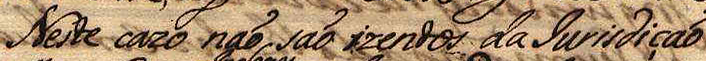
Neste cazo naõ saõ izentos da Iurisdiçaõ
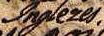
Inglezes.
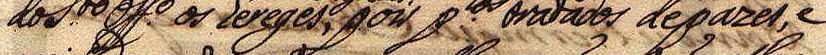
do s.to Off.o os hereges, pois p.los tratados de pazes, e
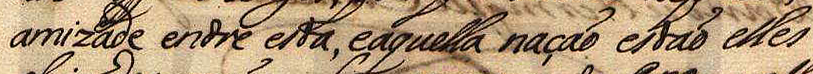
amizade entre esta, e aquella naçaõ estaõ elles
